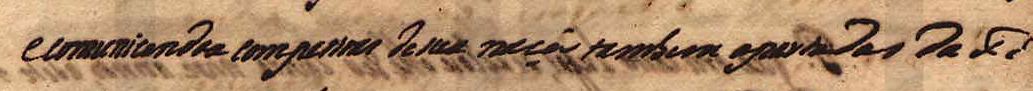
e comunicandoa com pessoas de sua naçaõ tambem apartadas da Fé
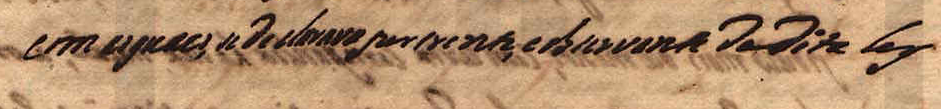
com as quaes se declarava por crente, e observante da dita ley
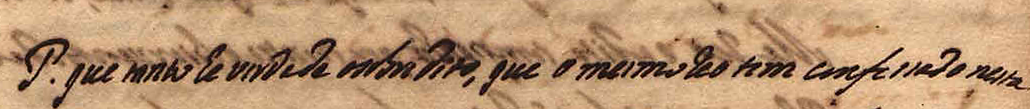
P. que tanto he verdade o sobredito, que o mesmo Reo tem confessado nesta
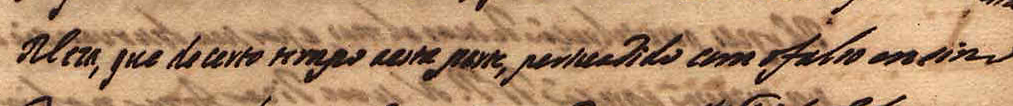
Meza, que de certo tempo a esta parte, persuadido com o falso ensino
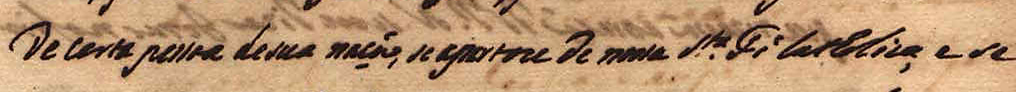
De certa pessoa de sua naçaõ, se apartou de nossa S.ta Fé Catholica, e se
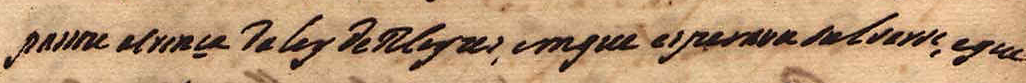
passou a crença da ley de Moyzes, em que esperava salvarse, e que
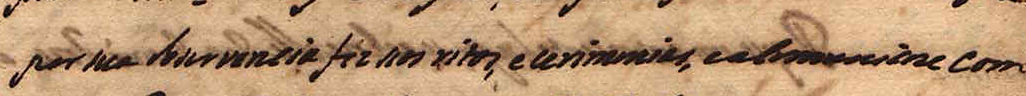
por sua observancia fez seos ritos, e cerimonias, e a comunicou com
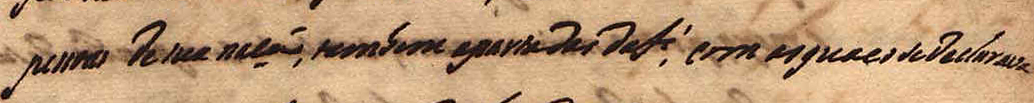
pessoas de sua naçaõ, tambem apartadas de Fé, com as quaes se declarava
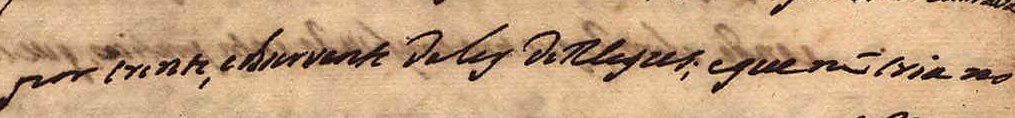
por crente, e observante da ley de Moyzes; e que não cria no
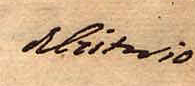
Misterio
